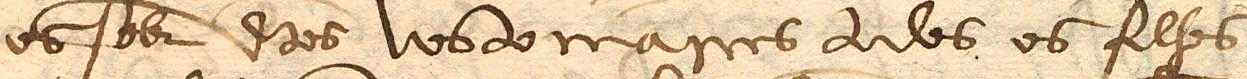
os s̄obr dtos vos tomarees todos os filhos
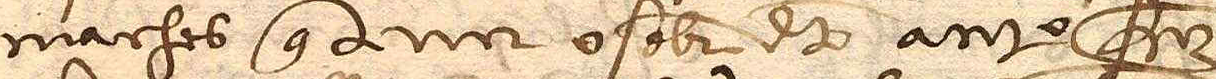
machos q̄ teuer o s̄obr d̄to anto f̄rrz
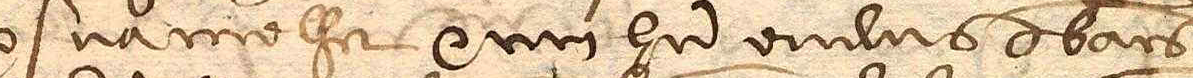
e sua molher e com hū ou dous tbães
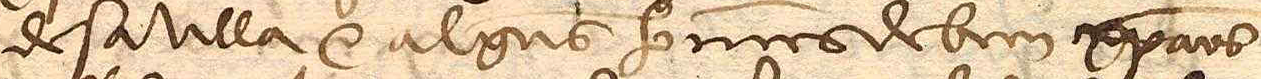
desa villa e algūs hom̄es de bem xpãos
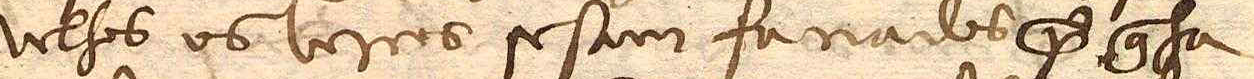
velhos os verees se sam fanados p̄oq̄ ha
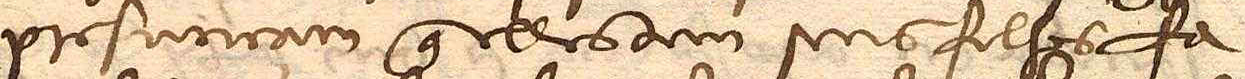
presunçam q̄ elles tem seus filhos fa
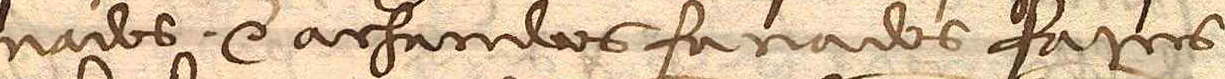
nados . e achandoos fanados farees
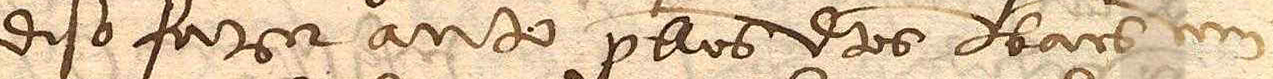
diso fazer auto p̄llos dt̄os tbães com
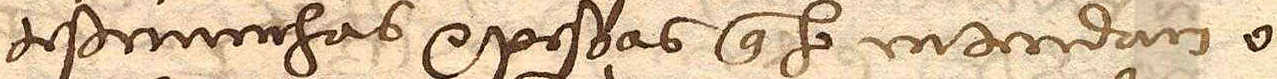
testemunhas e pesoas q̄ ho entendam o
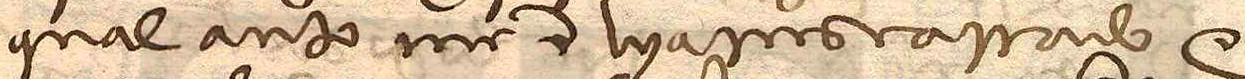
qual auto me ēvyarees carrado e
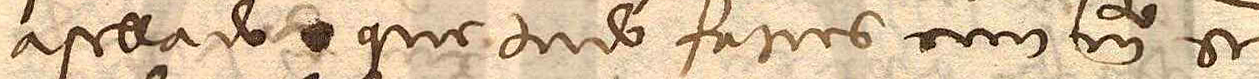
asellado o que tudo farees com mto se
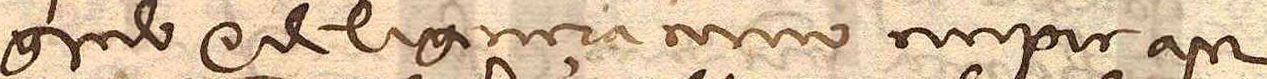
gredo e deligençia como cunpre a ser
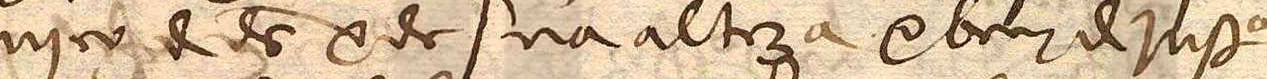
ujço de d̄s e de sua alteza e bem de Justa
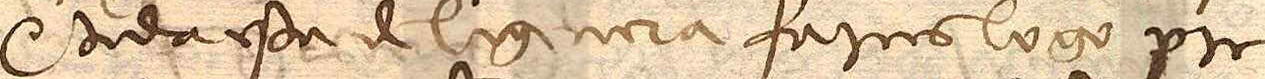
e toda esta deligencia farees logo pre
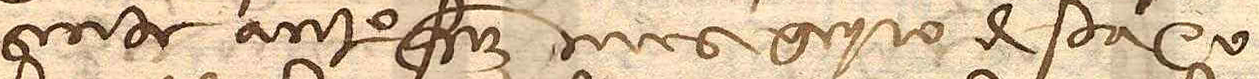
sente anto f̄rrz mesegeyro desta e o
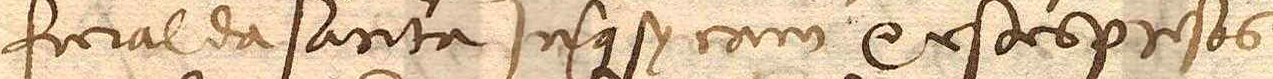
ficial da santa Jnq̄sycam e estes presos
